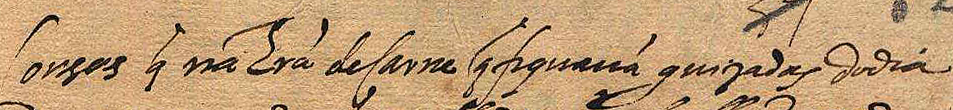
Cousas q̄ nā Erā de Carne q̄ fiquauā guizadas do dia
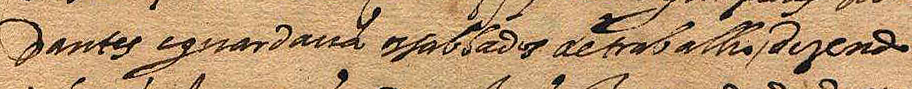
dantes e guardauā os sabbados de trabalho, dizendo
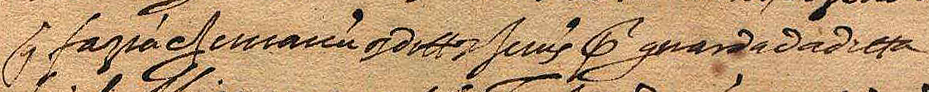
q̄ fazia e Jeiuauā os dittos Jeiūs p̄ guarda da ditta
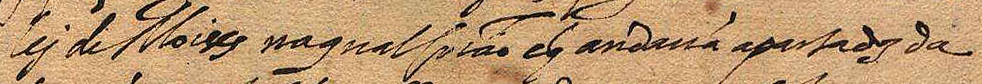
lej de Moises na qual Crião e q̄ andauā apartados da
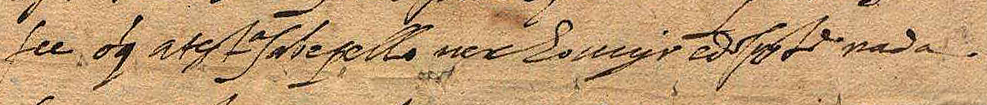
fee o q̄ a testa sabe pello uer E ouujr e do Custe nada
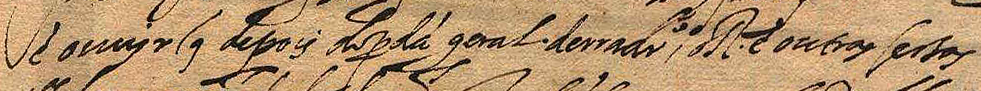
e ouujr q̄ depois do ꝑdā geraL derradro, o R. e outras Certas
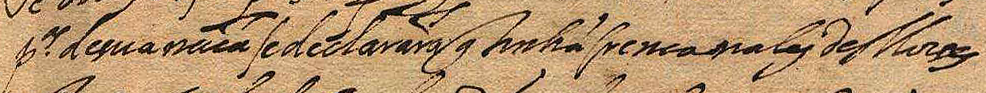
pas. de sua naçā se declararā q̄ tinhā Crença na lej de Moises
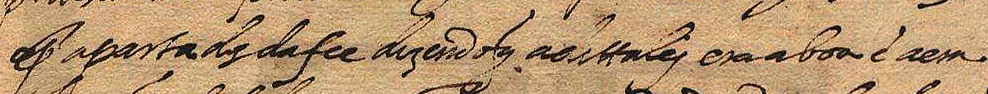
_ p̄ apartadas da fee dizendo q̄ a ditta lej era a boa e a em
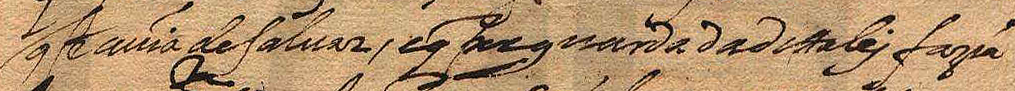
q̄ se auiā de saluar, e q̄ por guarda da ditta lej faziā
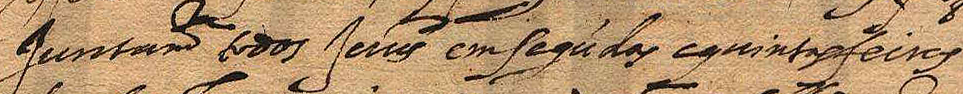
Juntamte todos Jeiūs em segūdas e quintas feiras
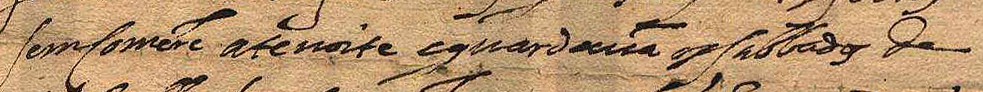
Sem Comerē ate noite e guardauā os sabbados de
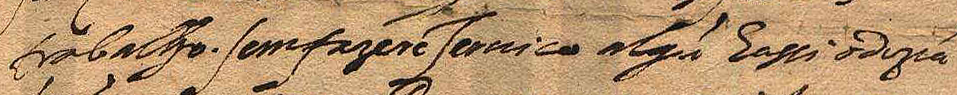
trabalho. sem fazerē seruiço algū E assi o diziā
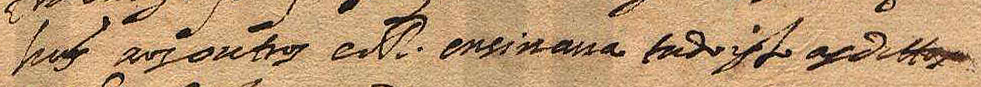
hus̄ aos outros e o R. ensinaua tudo isto as dittas
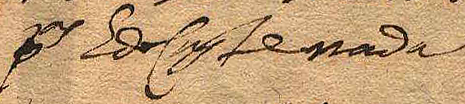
pas E do Custe nada
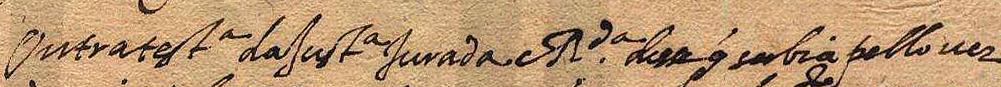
Outra testa da Justa Jurada e R.da disse q̄ sabia pello uer
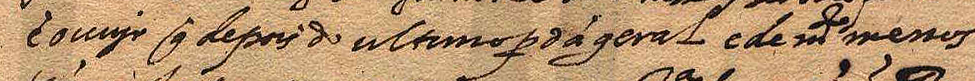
e ouujr q̄ depois do ultimo ꝑdā geraL e de mto menos
